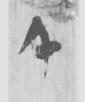千
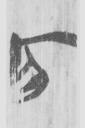戶
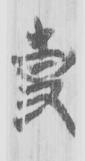吏
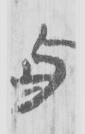此
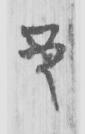邑
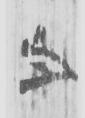之
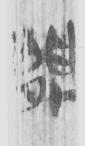{門外}
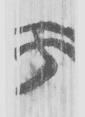于
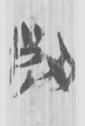列
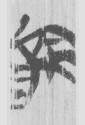疾
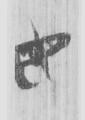母
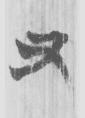又
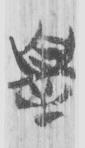辠
